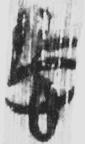忘
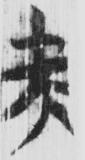夫
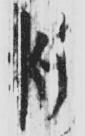朸
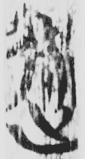述
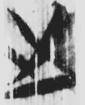之
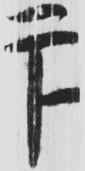下
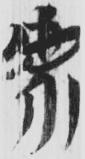{虍介}（乎）
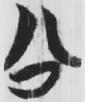公
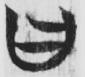曰
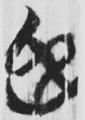臣
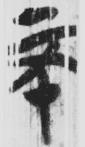不
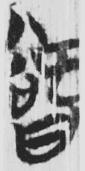○（知）
